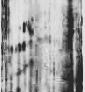子
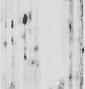司
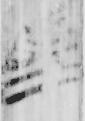馬
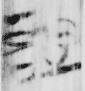○（屬）
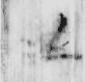之
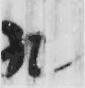九
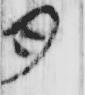月
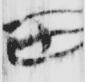甲
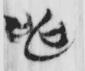申
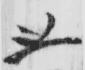之
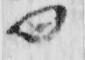日
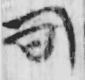司
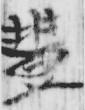豐（禮）
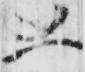之
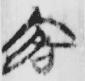客
